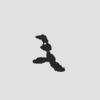旬
